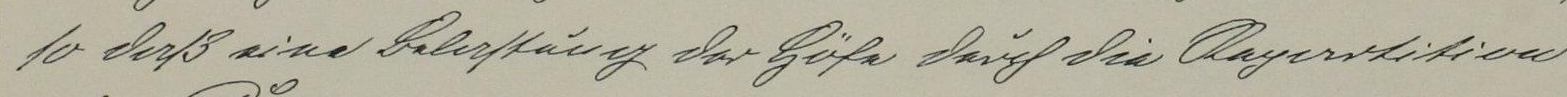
so daß eine Belastung der Höfe durch die Repartition
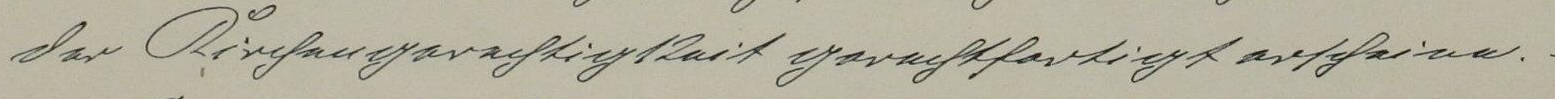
der Kirchengerechtigkeit gerechtfertigt erscheine.
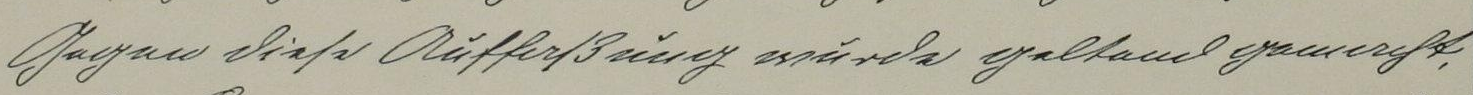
Gegen diese Auffaßung wurde geltend gemacht,
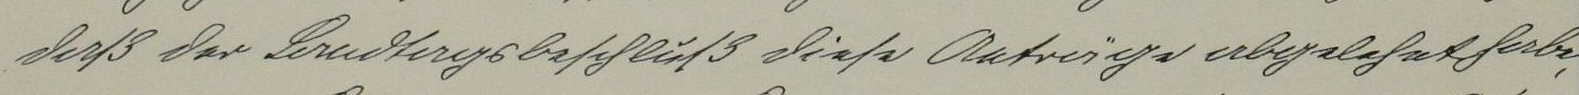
daß der Landtagsbeschluß diese Anträge abgelehnt habe,
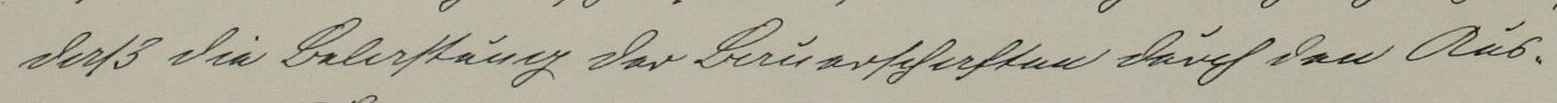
daß die Belastung der Bauerschaften durch den Aus-
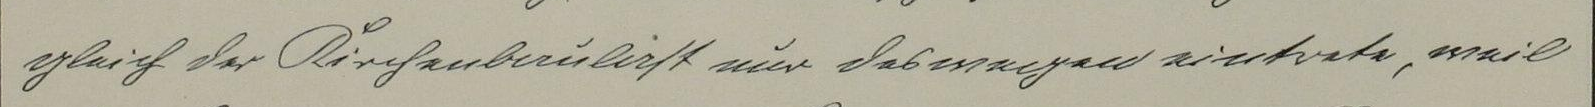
gleich der Kirchenbaulast nur deswegen eintrete, weil
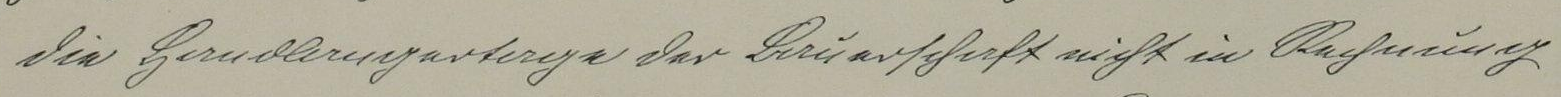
die Handlangertage der Bauerschaft nicht in Rechnung
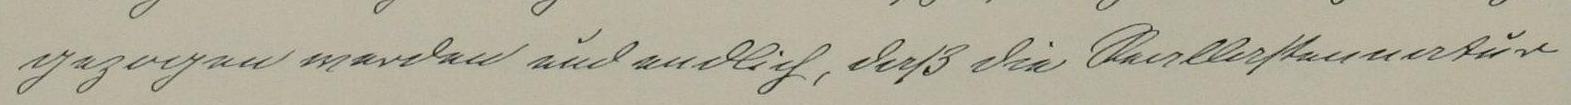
gezogen werden und endlich, daß die Reallastennatur
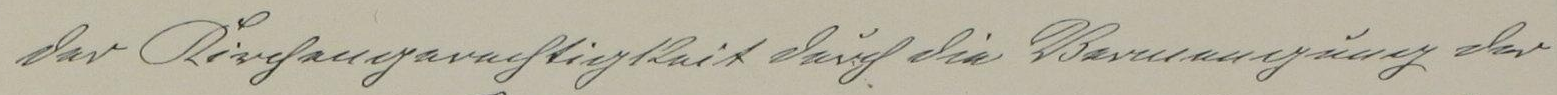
der Kirchengerechtigkeit durch die Vermengung der
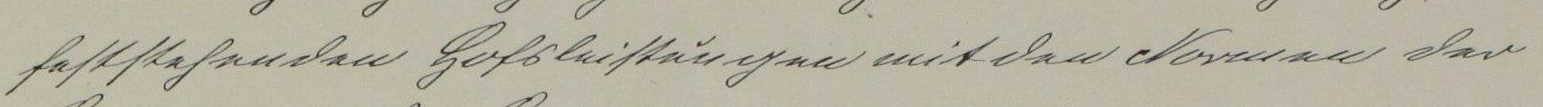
feststehenden Hofsleistungen mit den Normen der
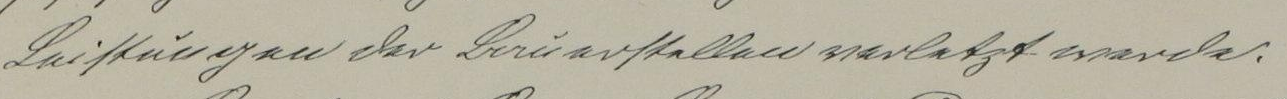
Leistungen der Bauerstellen verletzt werde.
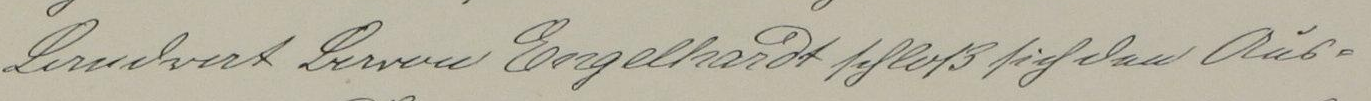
Landrat Baron Engelhardt schloß sich den Aus-
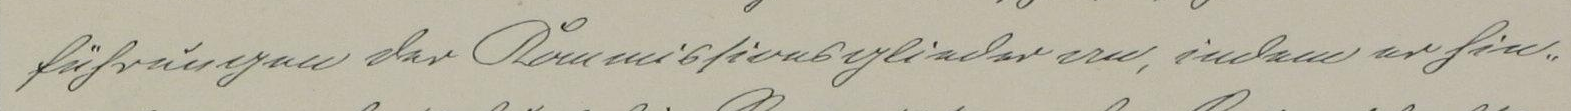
führungen der Kommissionsglieder an, indem er hin-
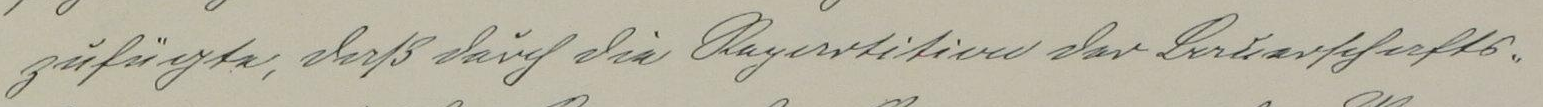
zufügte, daß durch die Repartition der Bauerschafts-
